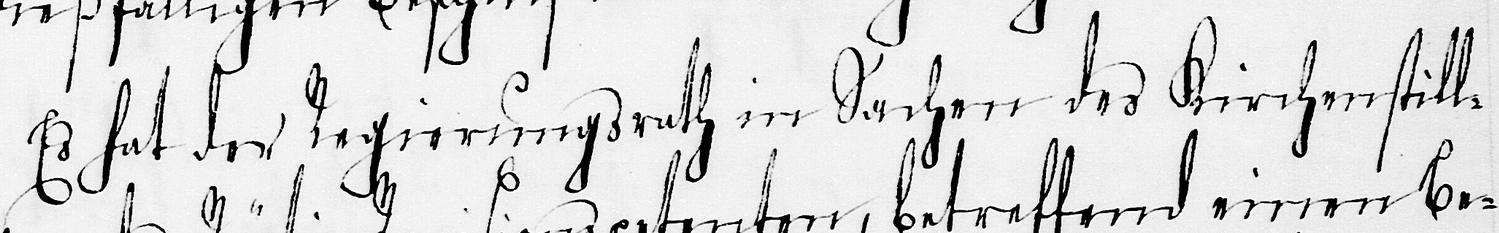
Es hat der Regierungsrath in Sachen des Kirchenstill¬
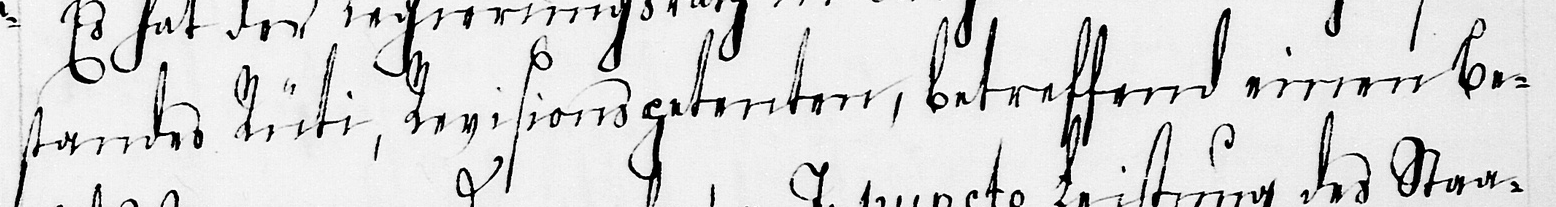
standes Rüti, Revisionspetenten, betreffend einen Be¬
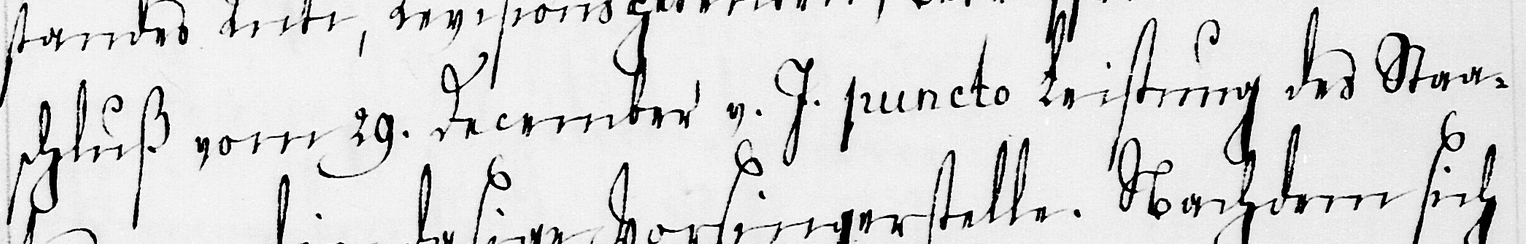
schluß vom 29. December v. J. puncto Leistung des Staa¬
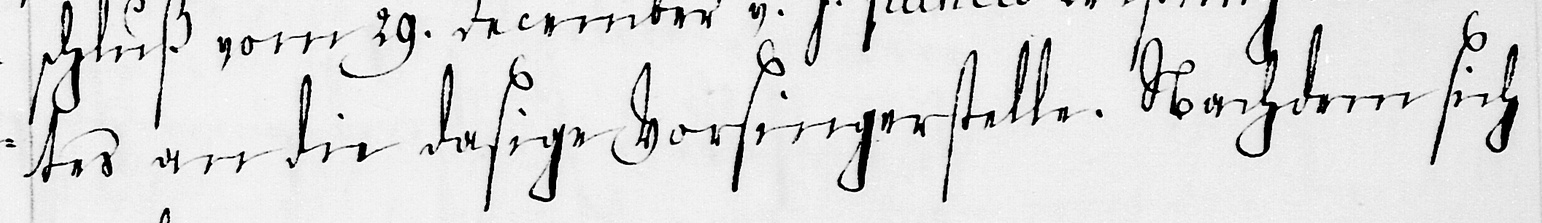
tes an die dasige Vorsingerstelle. Nachdem sich
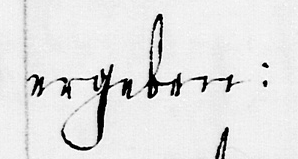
ergeben:
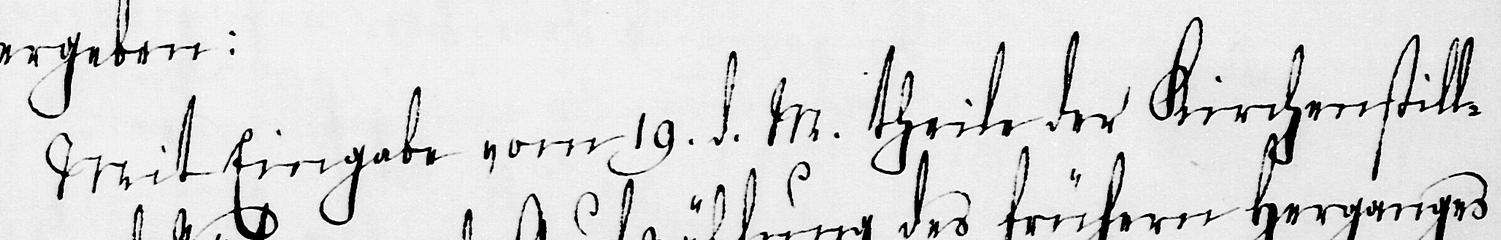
Mit Eingabe vom 19. d. M. theile der Kirchenstill¬
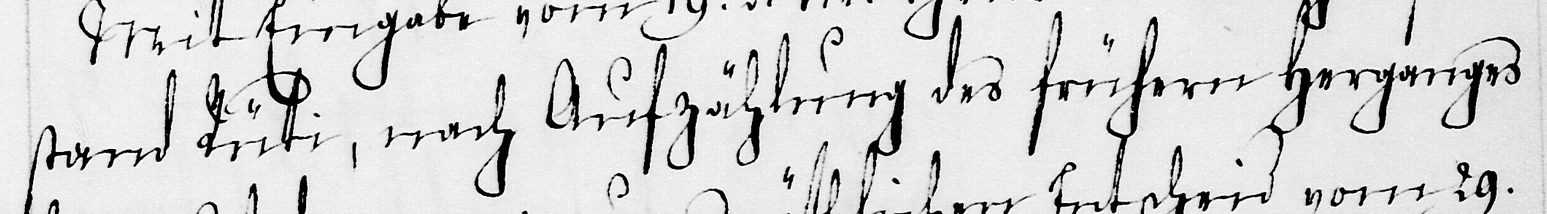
stand Rüti, nach Aufzählung des frühern Herganges
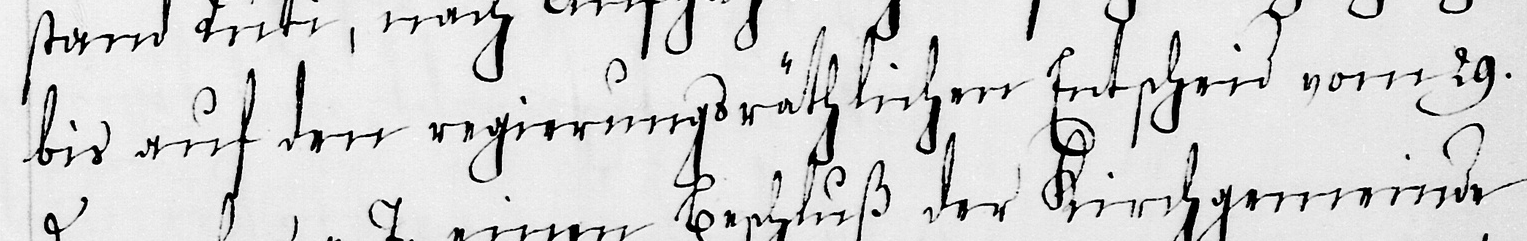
bis auf den regierungsräthlichen Entscheid vom 29.
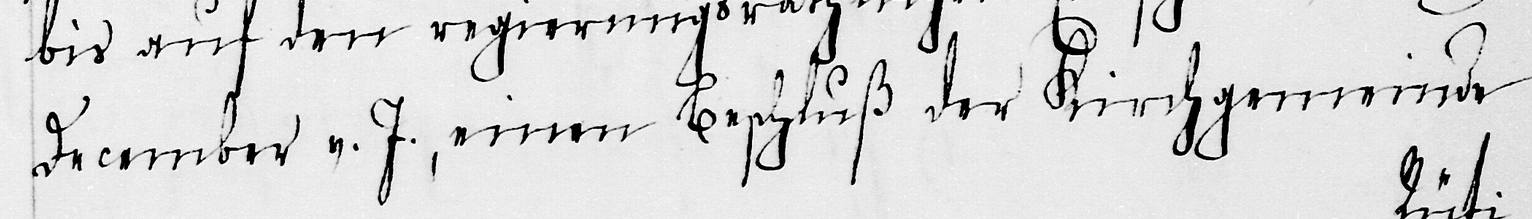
December v. J., einen Beschluß der Kirchgemeinde
